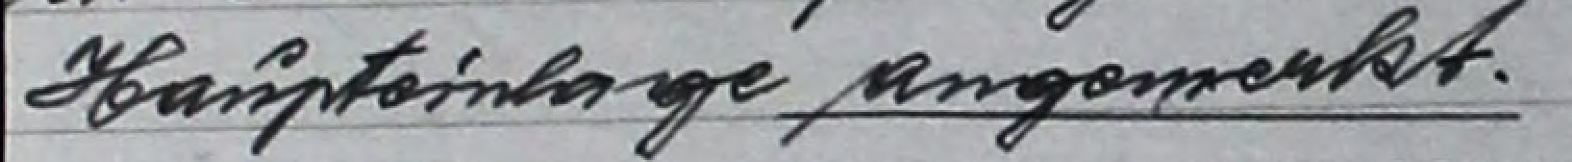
Haupteinlage angemerkt.
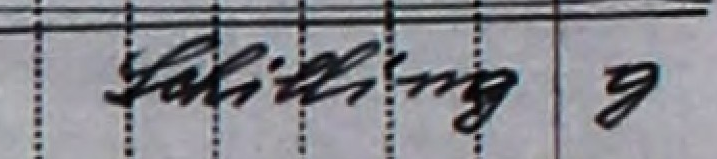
Schilling 9
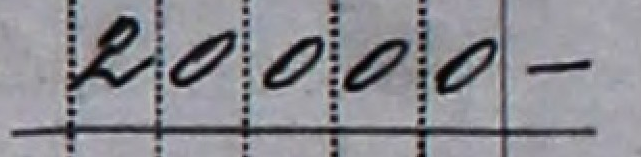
20000 -
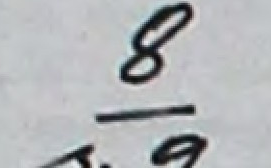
8
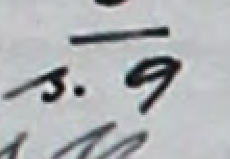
s. 9
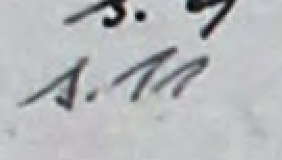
s. 11
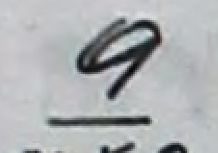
9
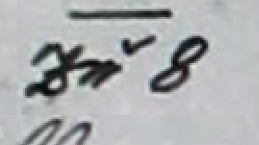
zu 8
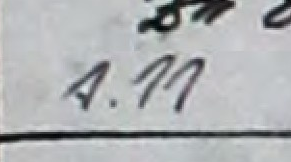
s. 11
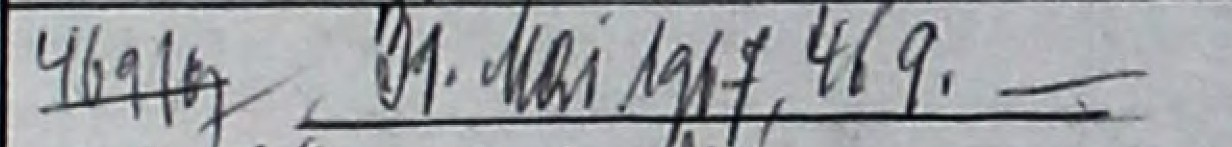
469/67 31. Mai 1967, 469.-
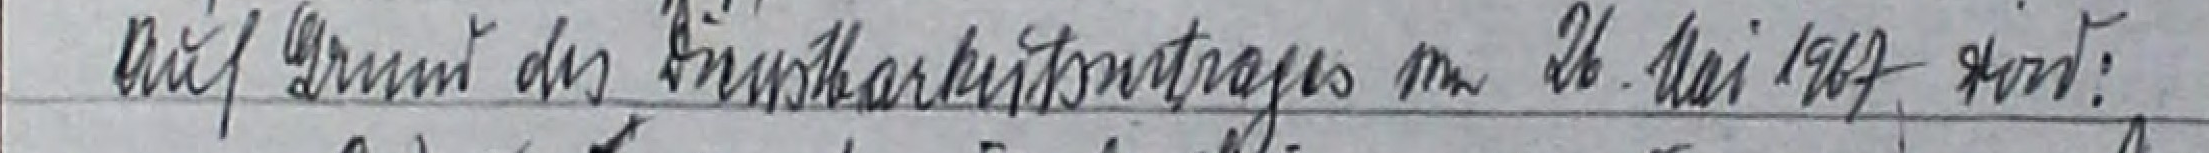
Auf Grund des Dienstbarkeitsertrages Mz 26. Mai 1967 wird:
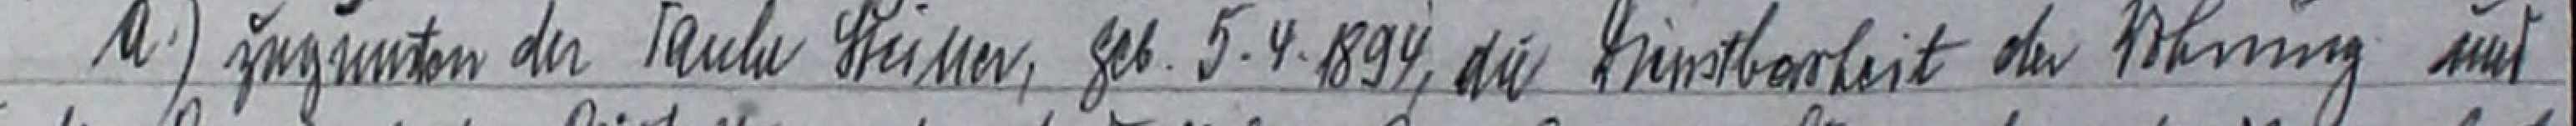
a.) zugunsten der Taula Keiner, geb. 5. 4. 1894, du Dienstbarkeit der Wohnung und
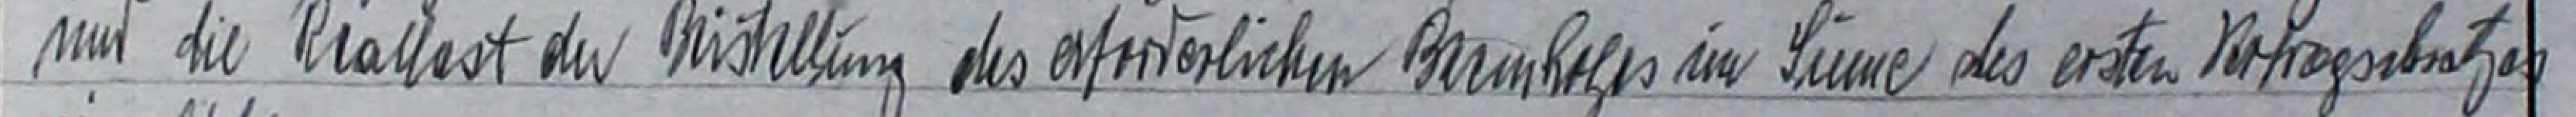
und die Reallast der Beistellung des aforderlichen Bermholzes im Sume des ersten Vertragsebsetzes
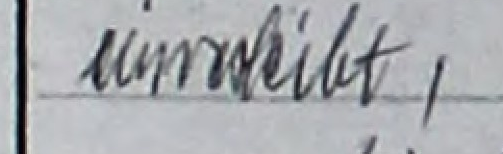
einverleibt,
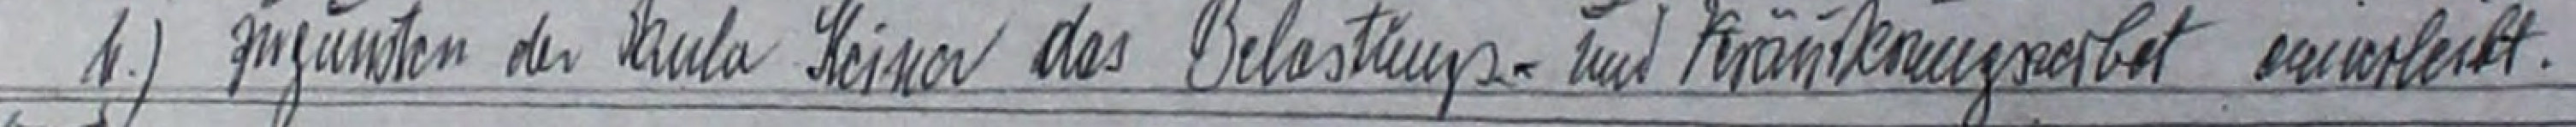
b.) zugunsten der Taula Keiner das Belastungs- und Veräußerungsverbot einverleibt.
